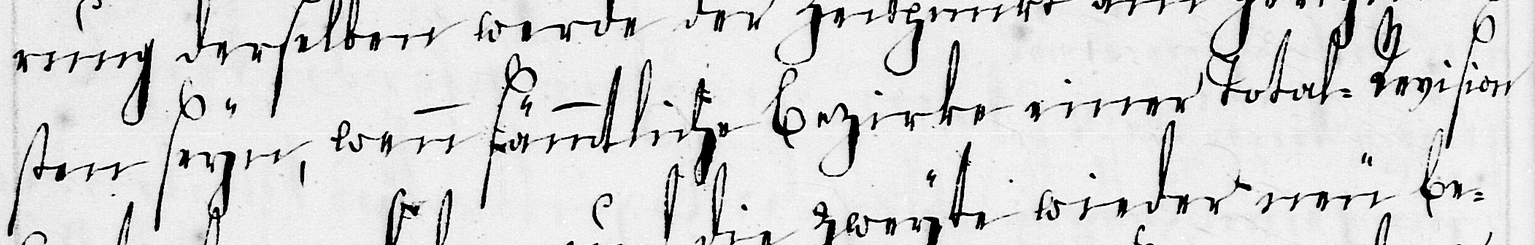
sten seyn, wenn sämmtliche Bezirke einer Total-Revision
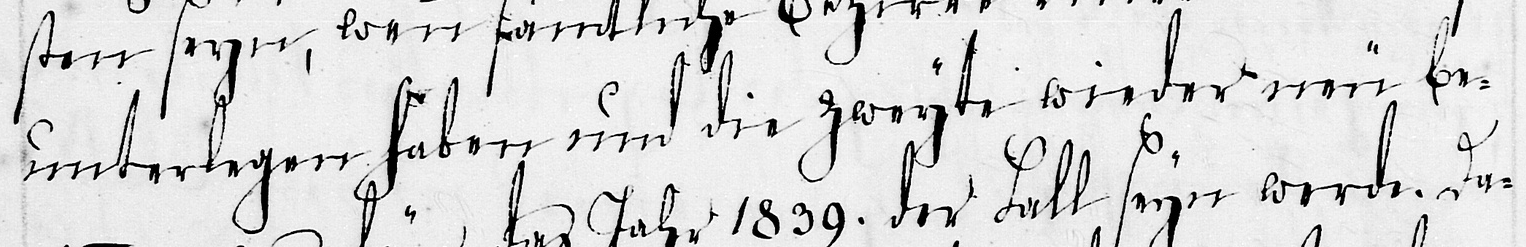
unterlegen haben und die zweyte wieder neu be¬
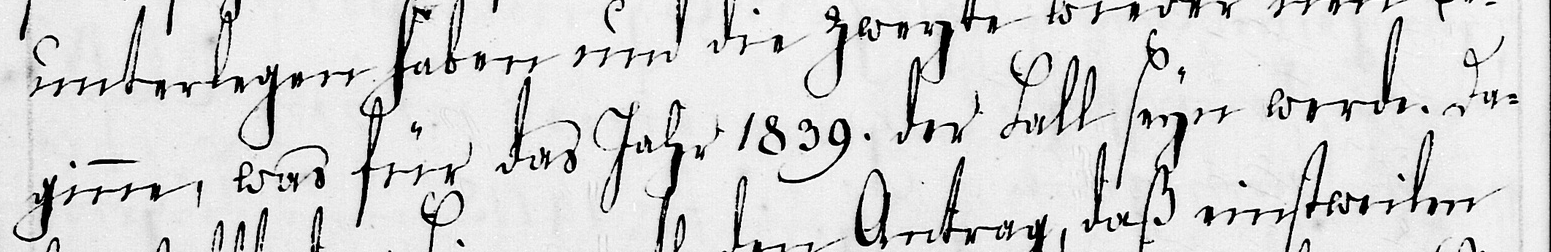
ginne, was für das Jahr 1839. der Fall seyn werde. Da¬
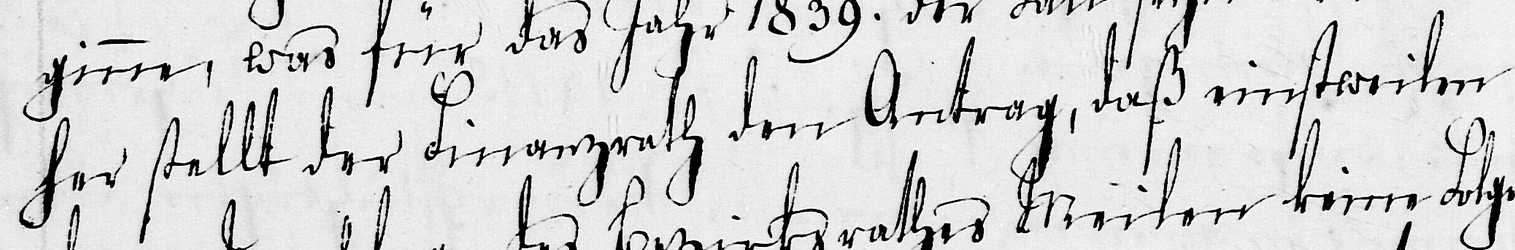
her stellt der Finanzrath den Antrag, daß einstweilen
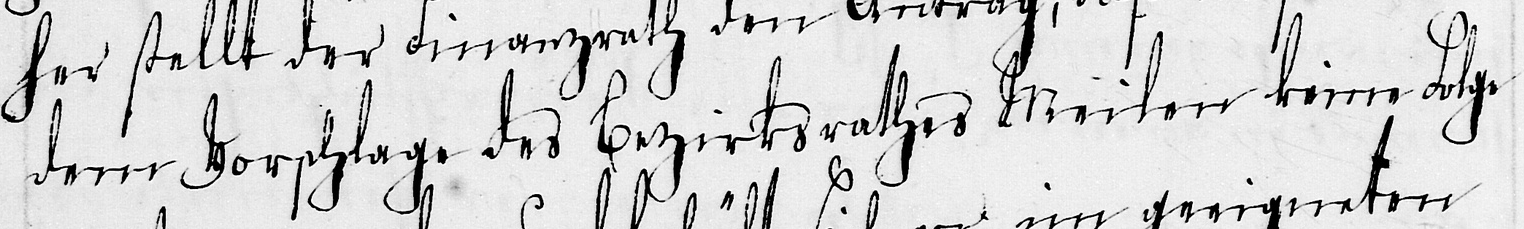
dem Vorschlage des Berzirksrathes Meilen keine Folge
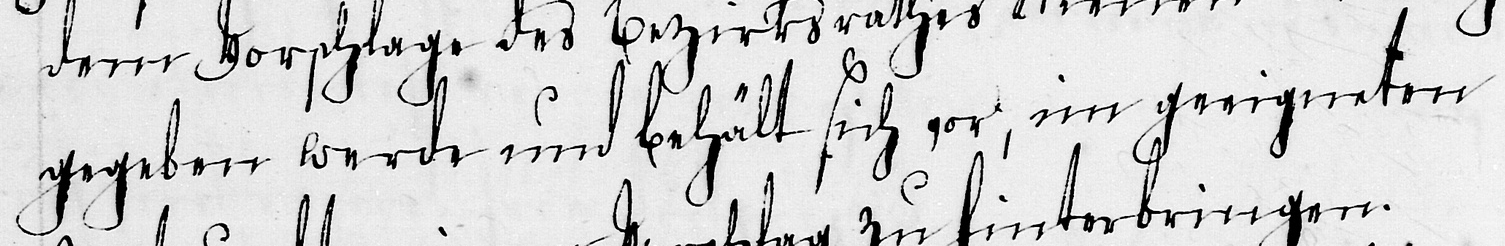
gegeben werde und behält sich vor, im geeigneten
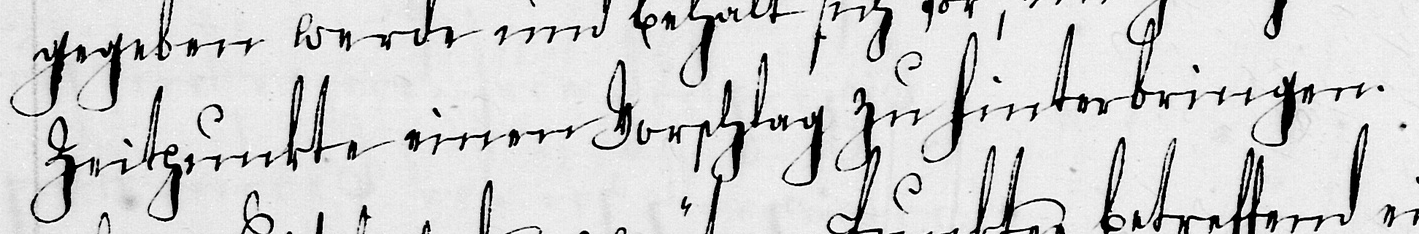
Zeitpunkte einen Vorschlag zu hinterbringen.
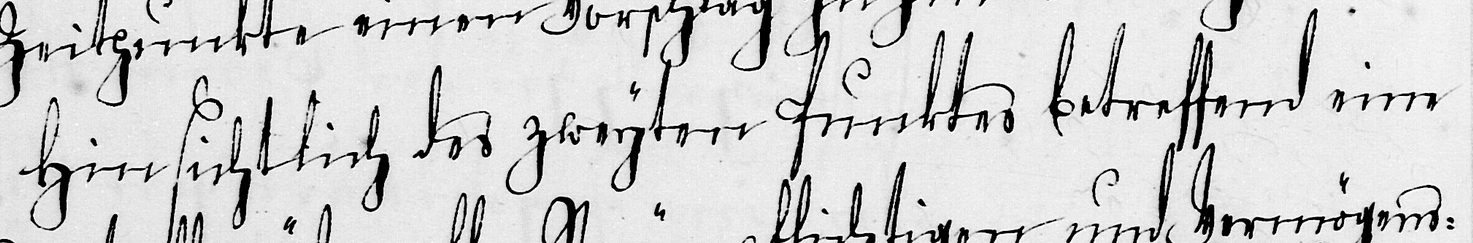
Hinsichtlich des zweyten Punktes betreffend eine
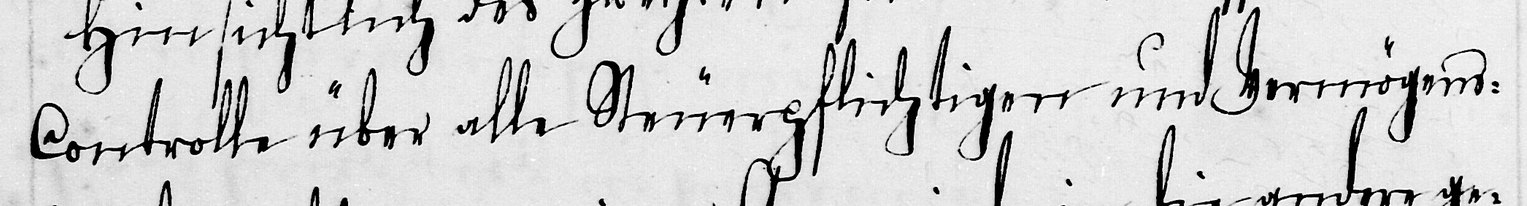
Controlle über alle Steuerpflichtigen und Vermögens¬
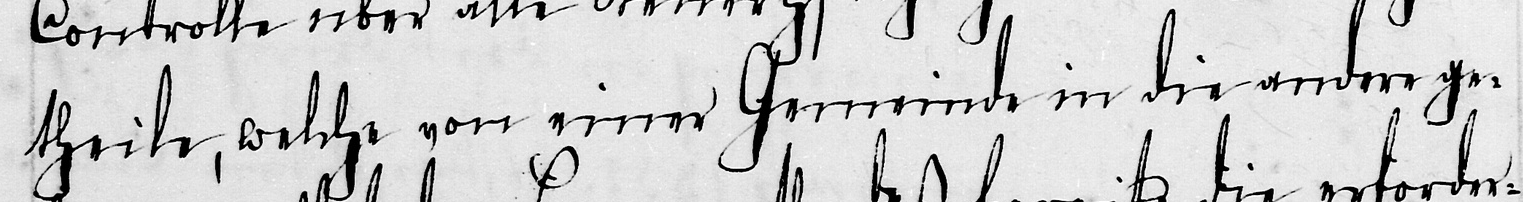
theile, welche von einer Gemeinde in die andere ge¬
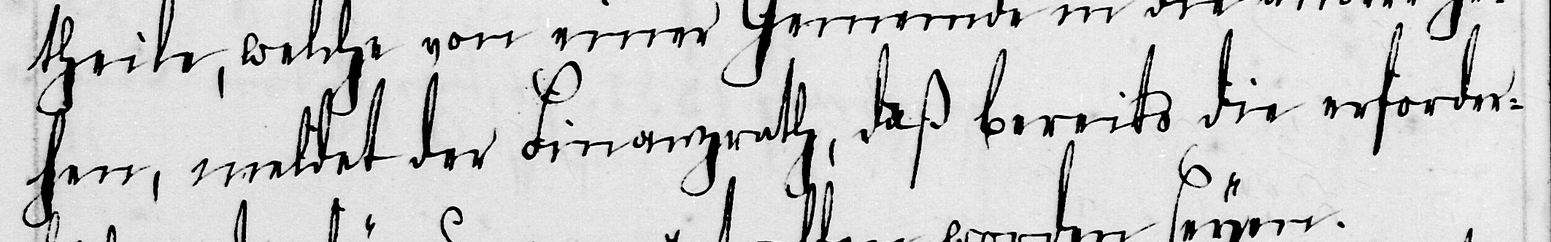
hen, meldet der Finanzrath, daß bereits die erforder¬
